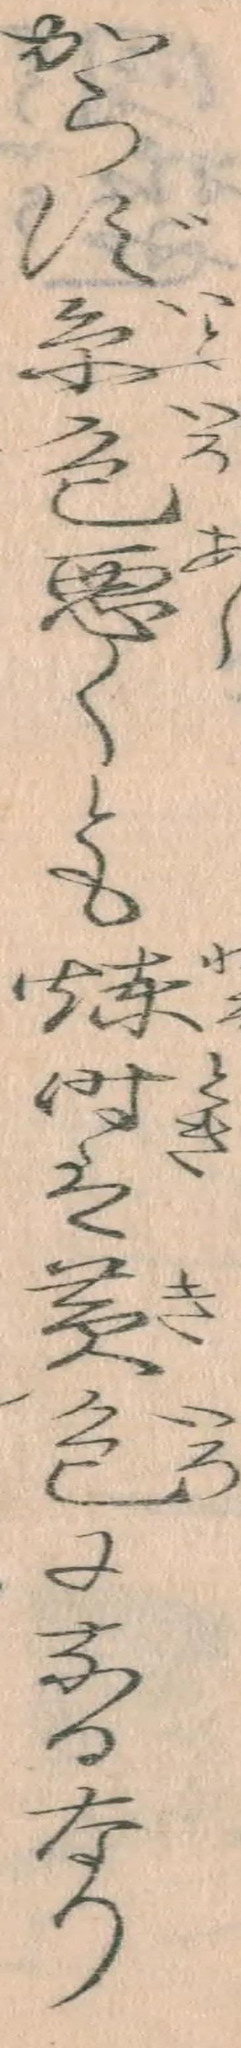からず糸色悪くとも煉時は黄色になるなり
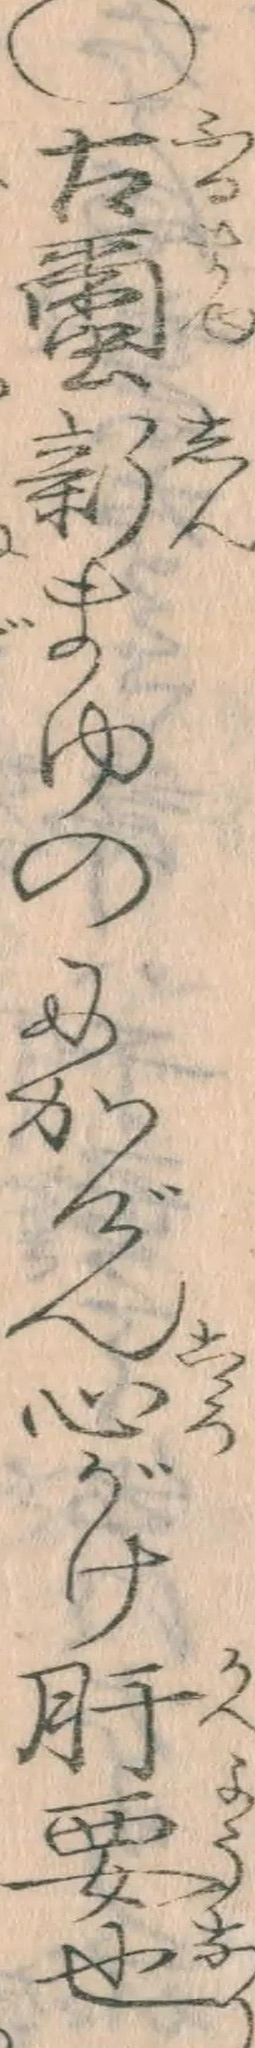○古繭新まゆのにかげん心がけ肝要也
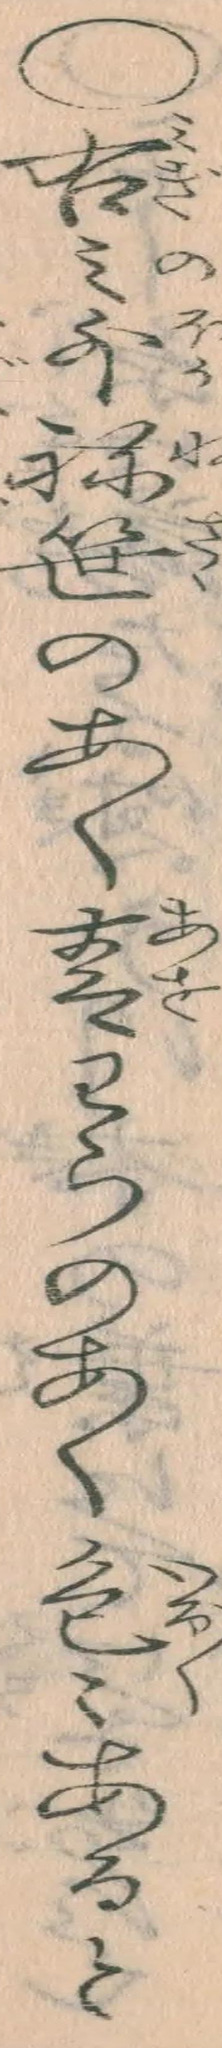○右之外祢笹のあく青わらのあく色々あると
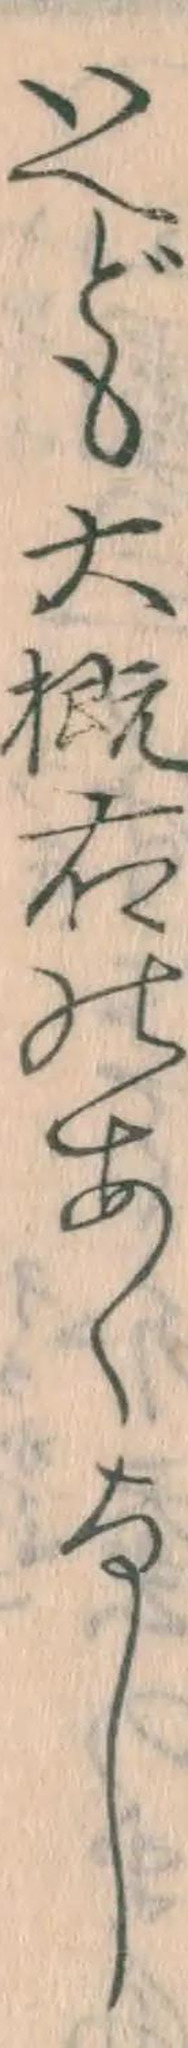いへども大概右のあくよし
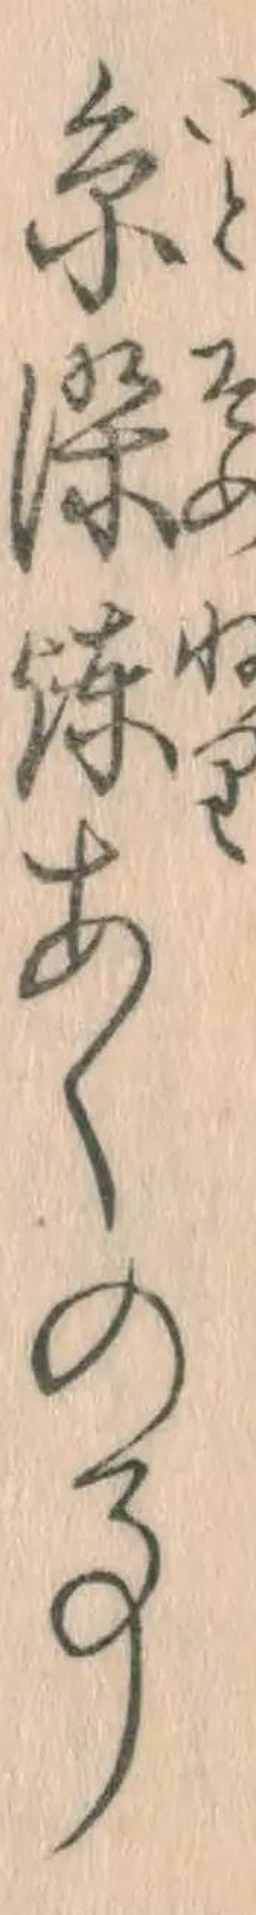糸染煉あくの事
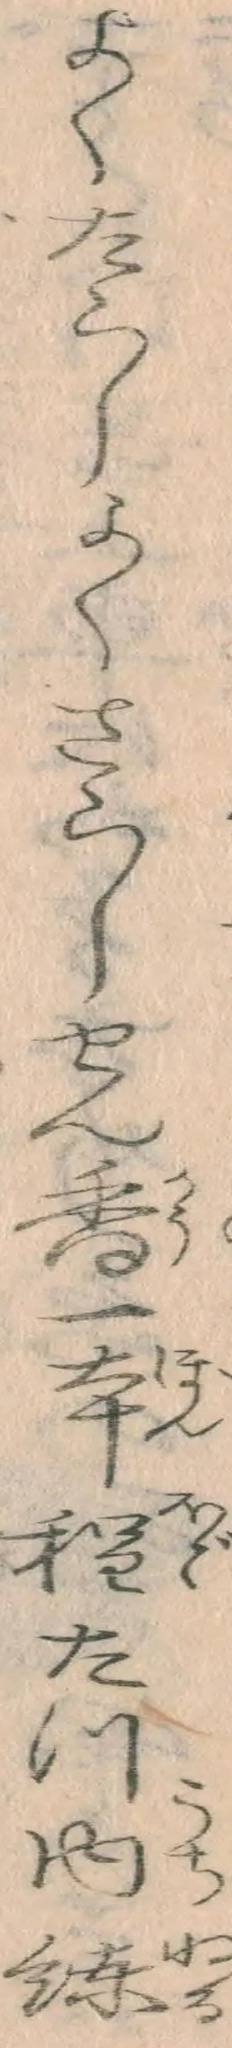よくたらしよくさらしせん香一本程たつ内煉
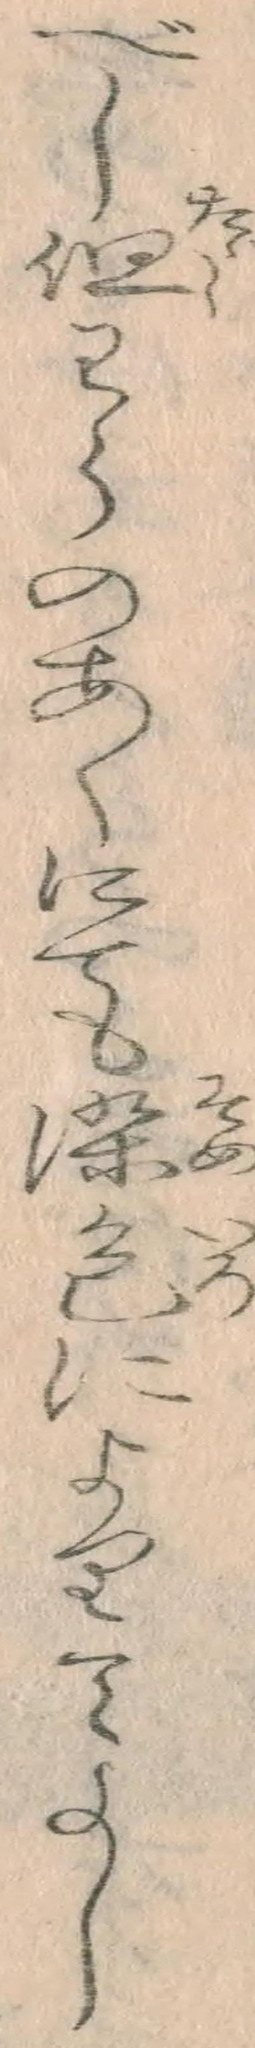べし但わらのあくにても染色によりてよし
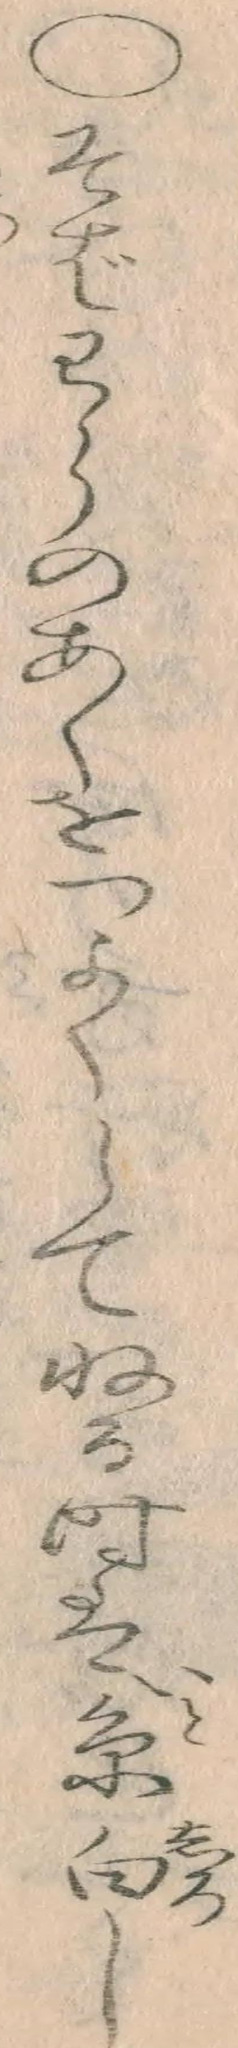○そばわらのあくをつよくしてねる説きは糸白し
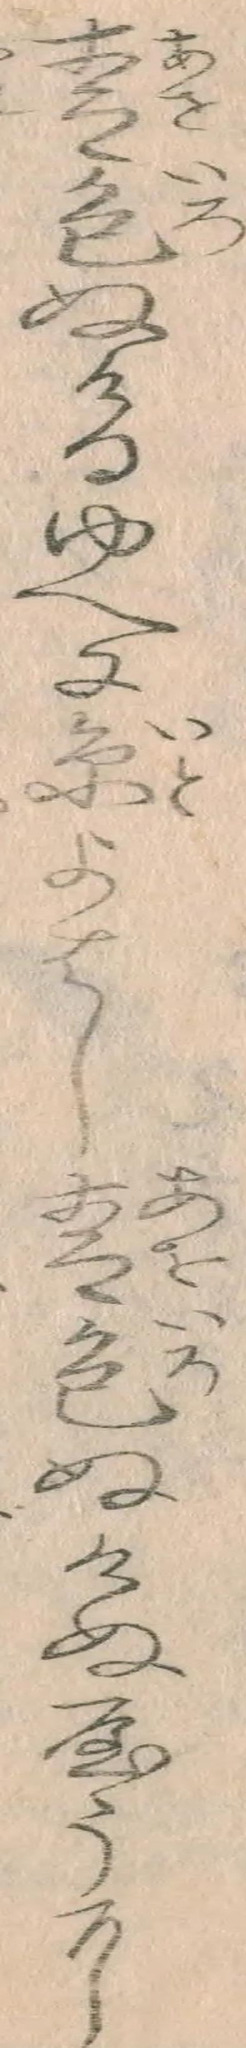青色ぬけるゆへに糸よはし青色ぬけぬやうに
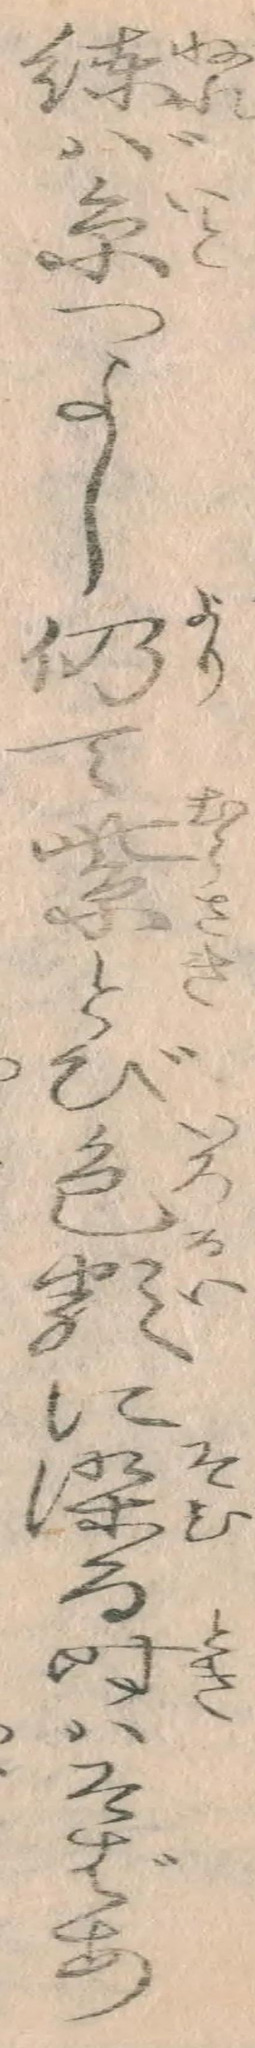煉ば糸つよし仍て紫とび色類に染る時はそばあ
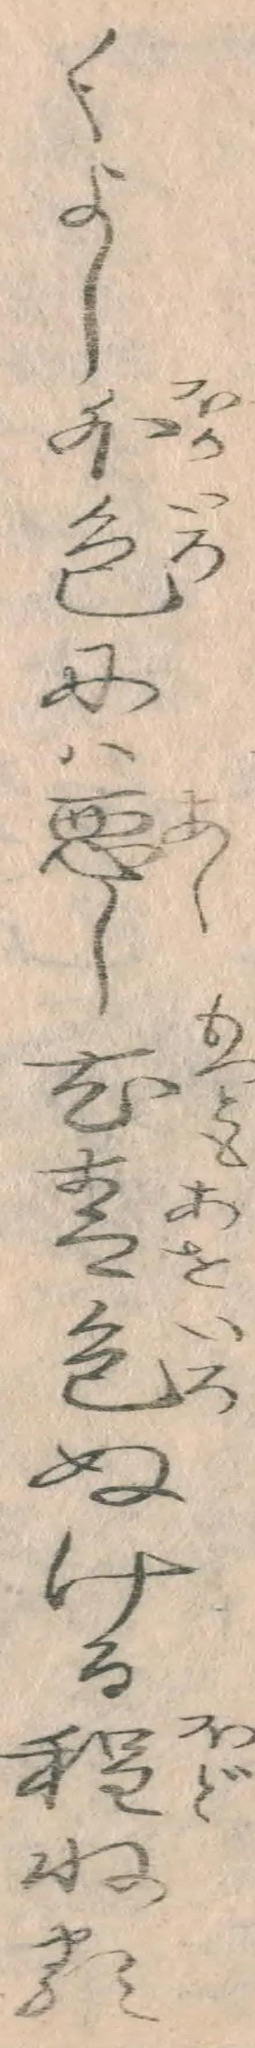くよし外色には悪し尤青色ぬける程ねる
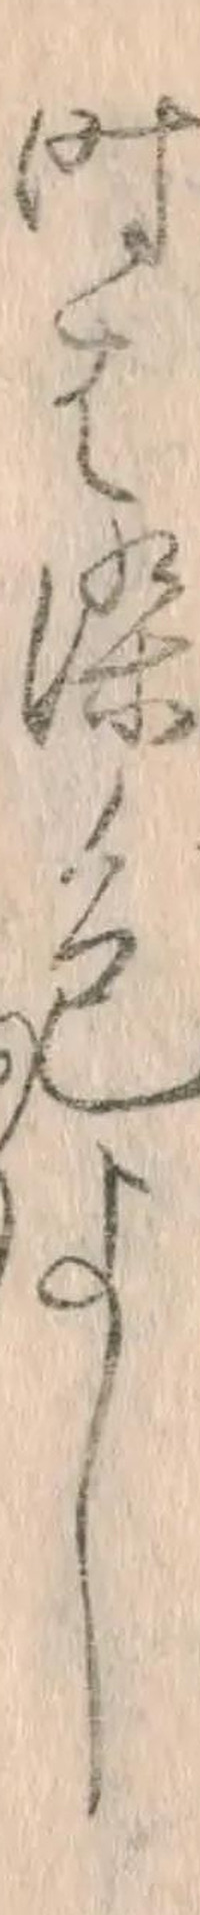時は染色よし
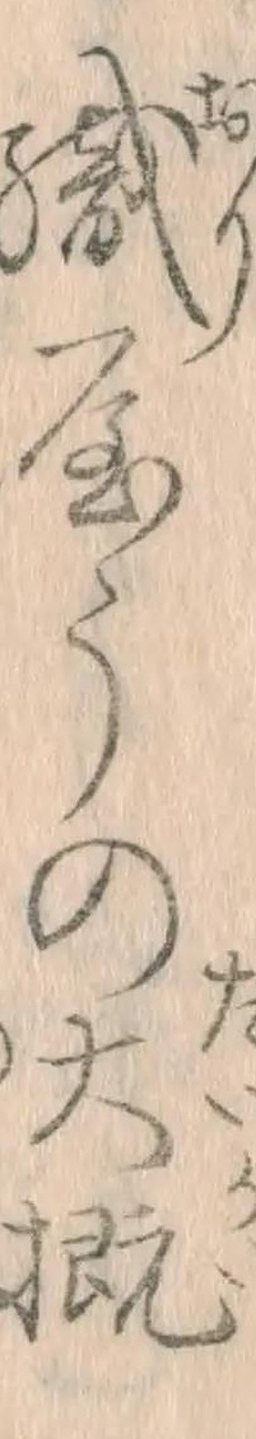織やうの大概
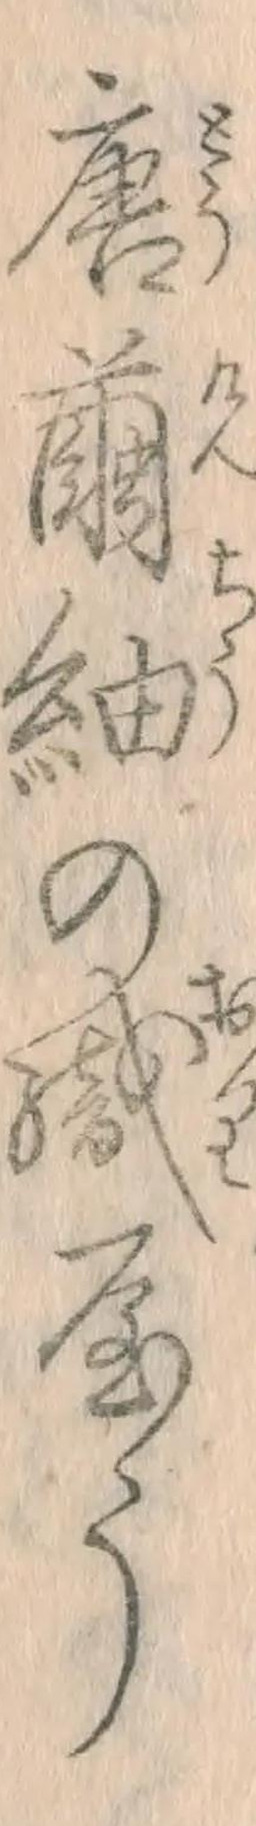唐繭紬の織やう

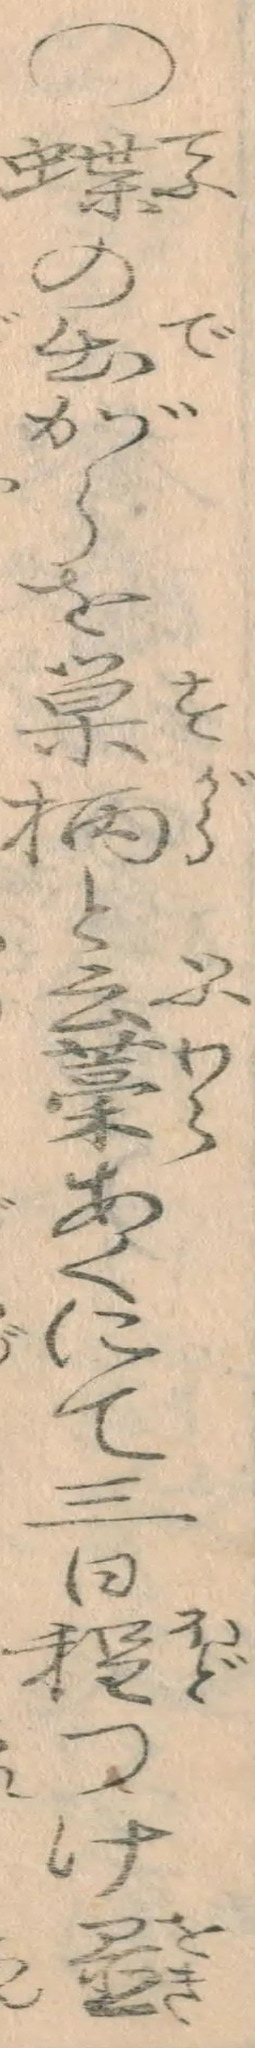○蝶の出がらを巣柄と云藁あくにて三日程つけ置
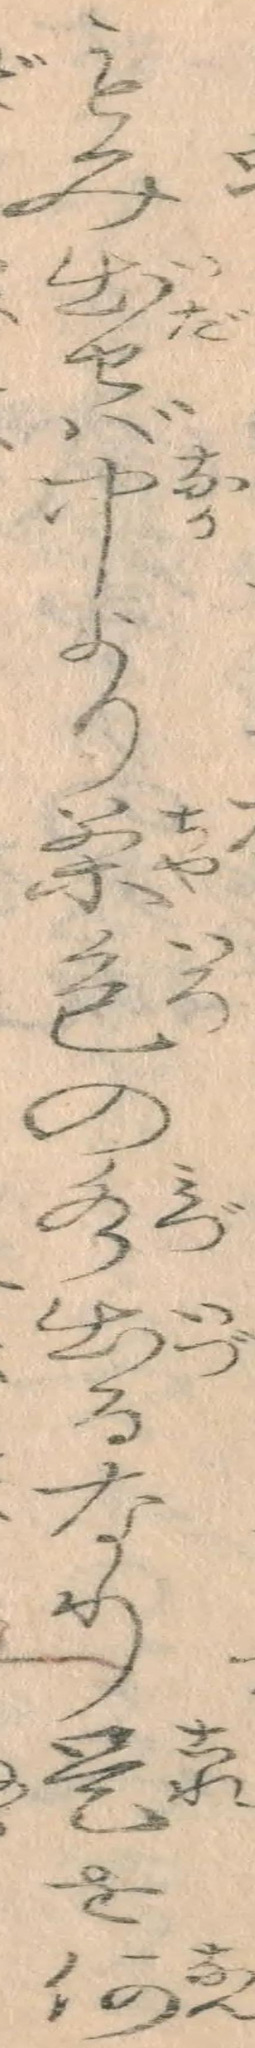もみ出せば中より茶色の水出るなり是を何
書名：山繭養法秘傳抄
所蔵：国立国会図書館 National Diet Library, JAPAN
